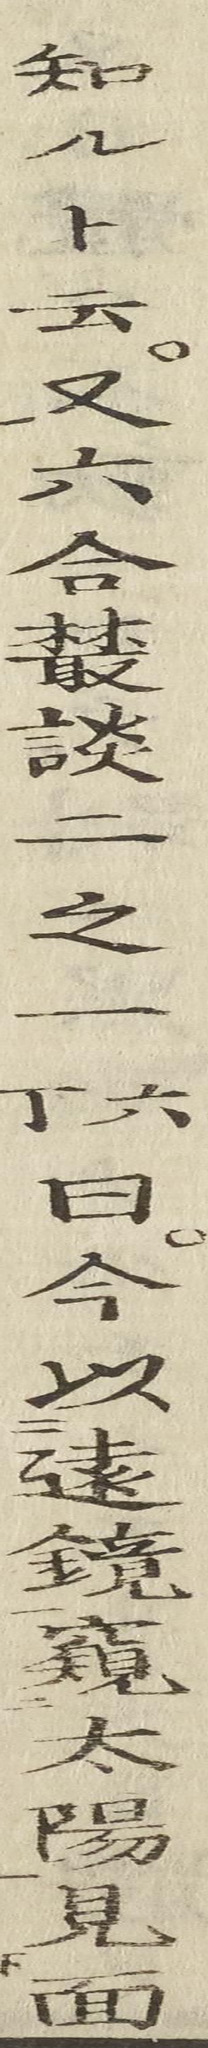知ルト云。又六合樷談ニ之一六丁曰。今以ニ遠鏡窺ニ太陽見面
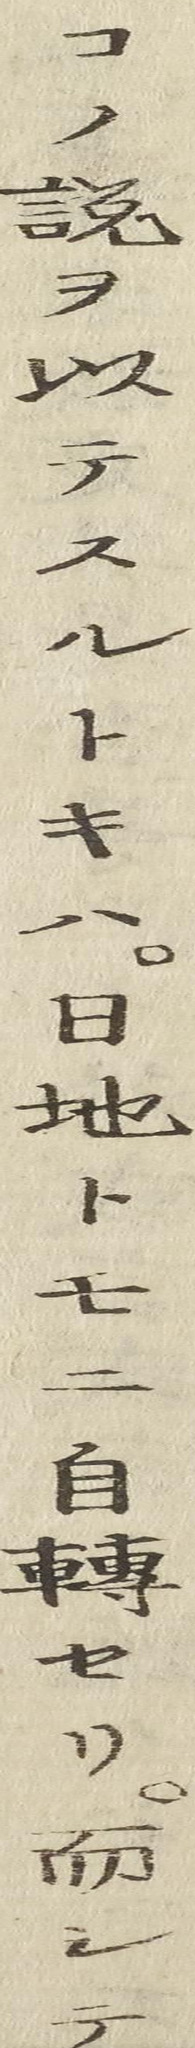コノ説ヲ以テスルトキハ。日地トモニ自転セリ。而シテ
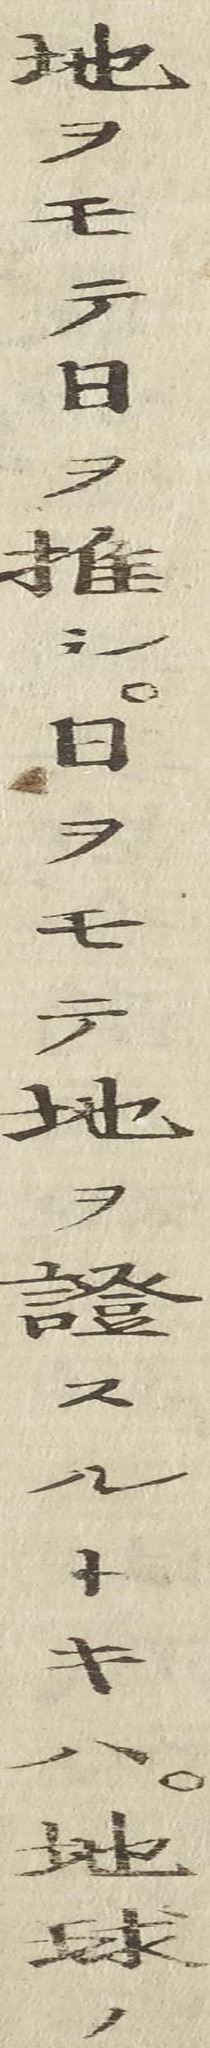地ヲモテ日ヲ推シ。日ヲモテ地ヲ証スルトキハ。地球ノ
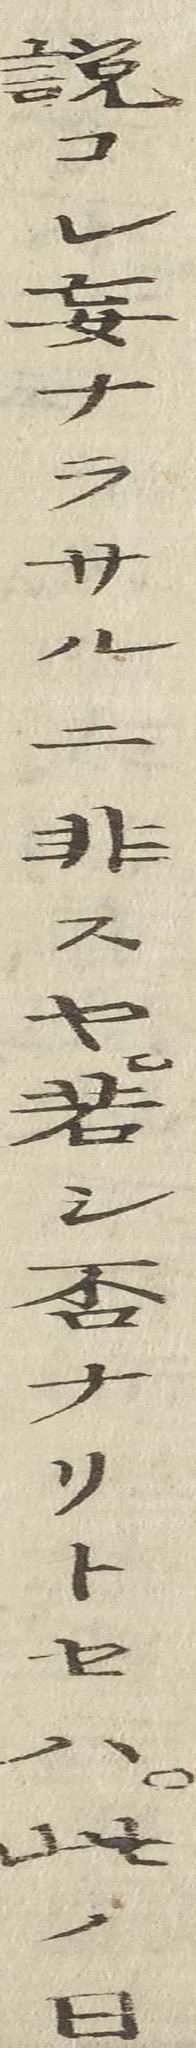説コレ妄ナラサルニ非スヤ。若シ否ナリトセハ。此ノ日
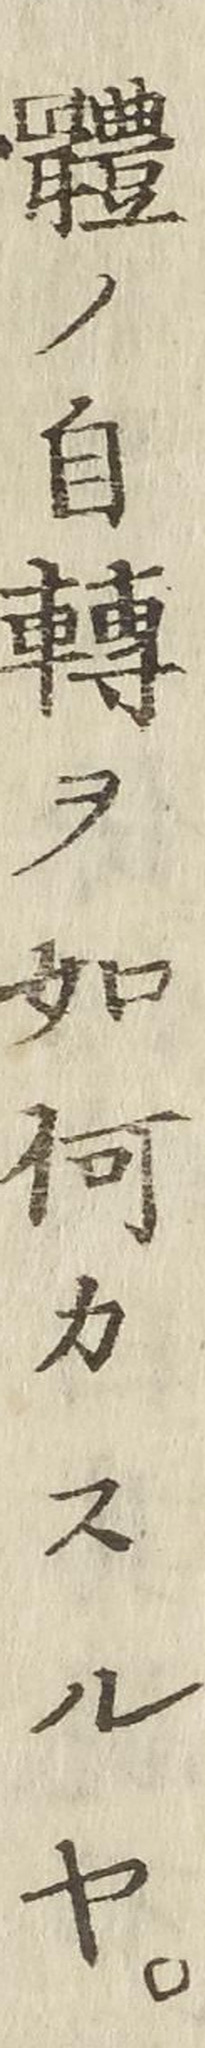体ノ自転ヲ如何カスルヤ。
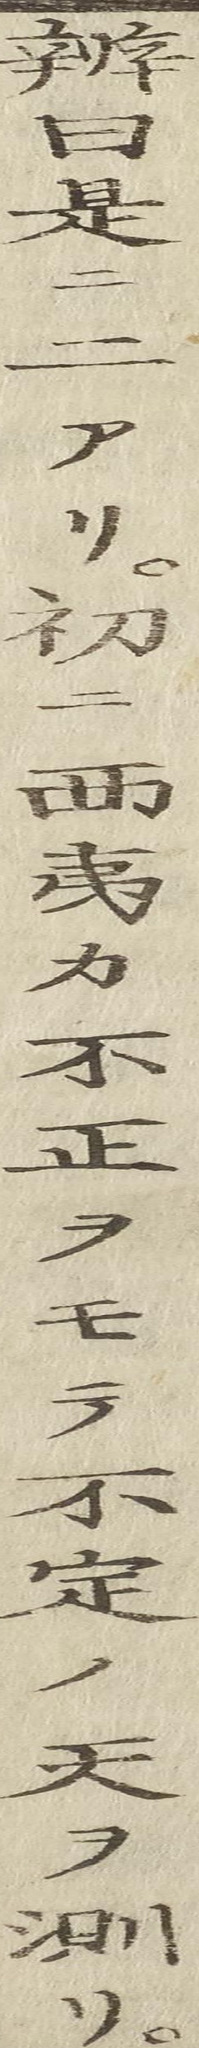弁曰是ニニアリ。初ニ西夷カ不正ヲモテ不定ノ天ヲ測リ。
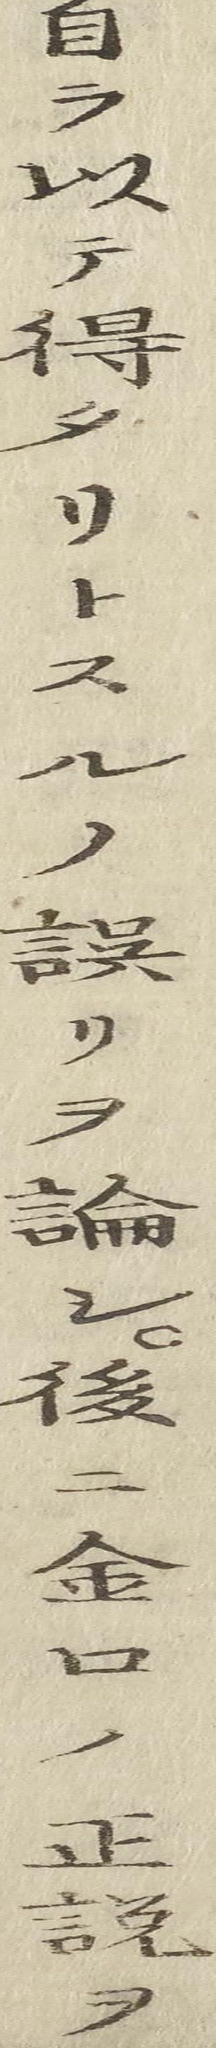自ラ以テ得タリトスルノ誤リヲ論シ。後ニ金ロノ正説ヲ

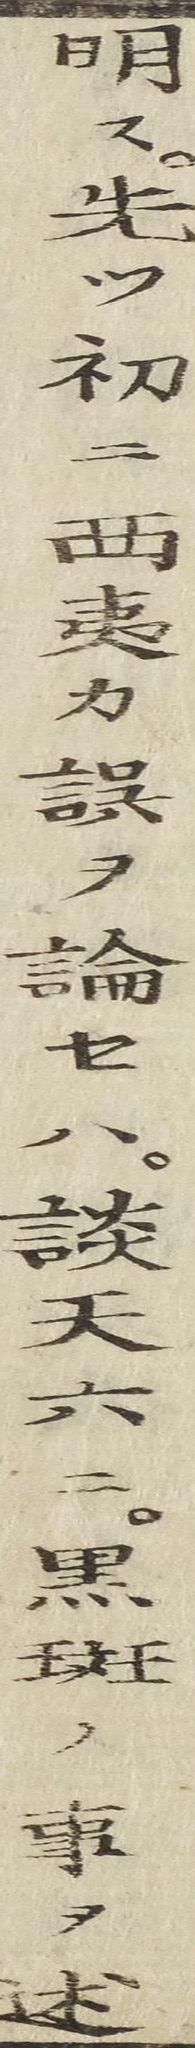明ス。先ツ初ニ西夷カ誤ヲ論セハ。談天六ニ。黒斑ノ事ヲ述
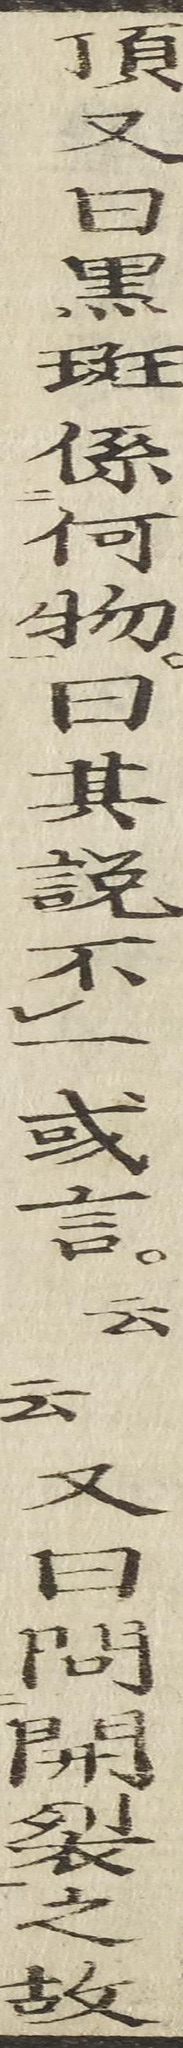頂又日黒斑係ニ何物。曰其説不一或言。云云又曰問ニ開裂之故
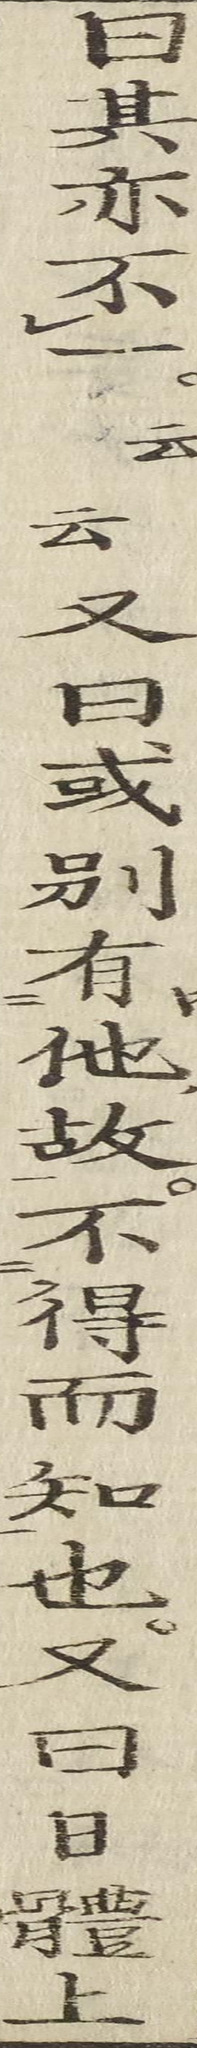曰其亦不一。云云又曰或別有他故。不ニ得而知也。又曰日体上
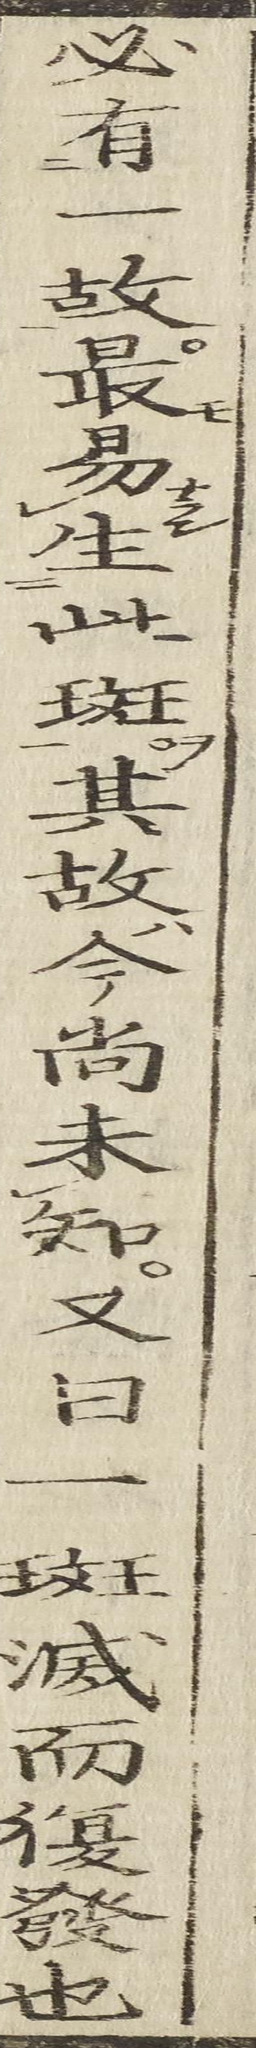必有ニ一故。最易生ニ此斑。其故今尚未知。又曰一斑滅而復発也
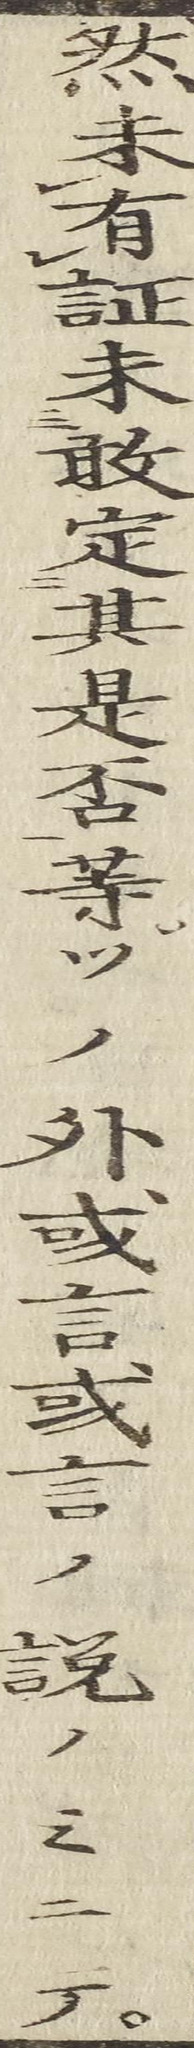然未有証未敢定ニ其是否等。ツノ外或言或言ノ説ノミニテ。
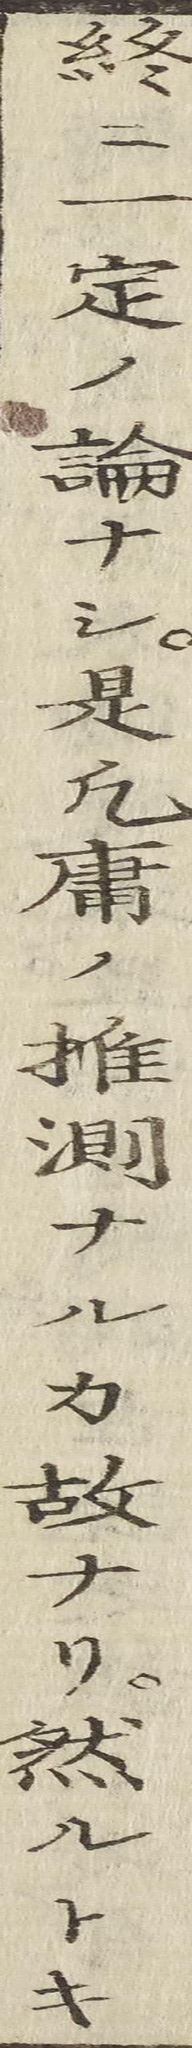終ニ一定ノ論ナシ。是凡庸ノ推測ナルカ故ナリ。然ルトキ
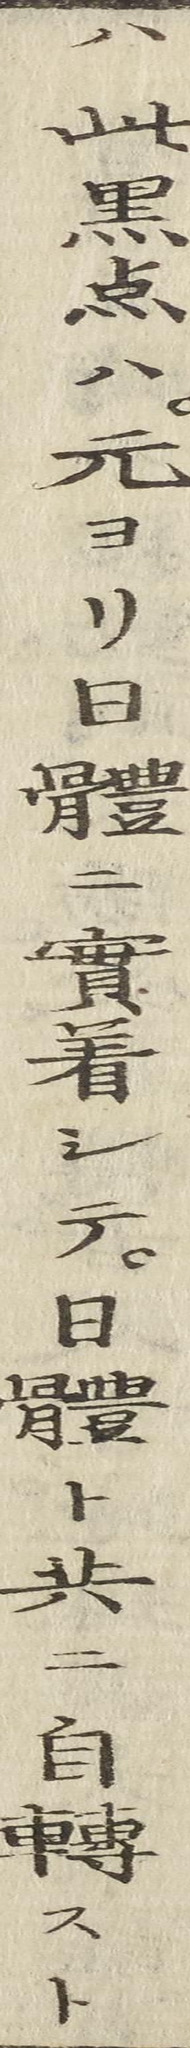ハ此黒点ハ。元ヨリ日体ニ実着シテ。日体ト共ニ自転スト
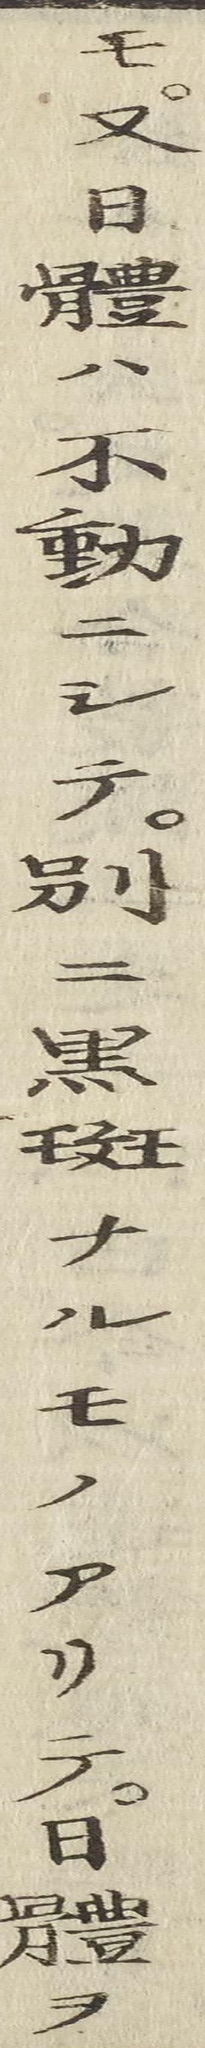モ。又日体ハ不動ニシテ。別ニ黒斑ナルモノアリテ。日体ヲ
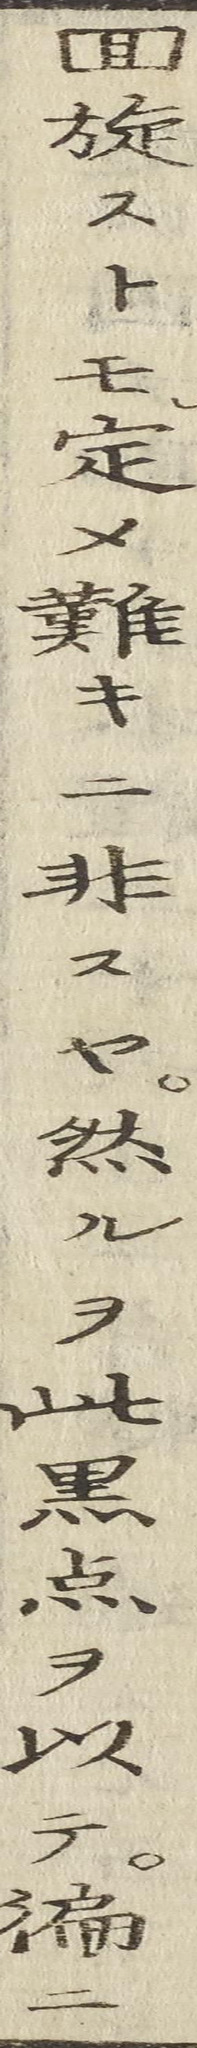回旋ストモ。定メ難キニ非スヤ。然ルヲ此黒点ヲ以テ。徧ニ
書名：護法新論　二編　中
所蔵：東京大学地震研究所図書室 Earthquake Research Institute Library, The University of Tokyo, JAPAN
